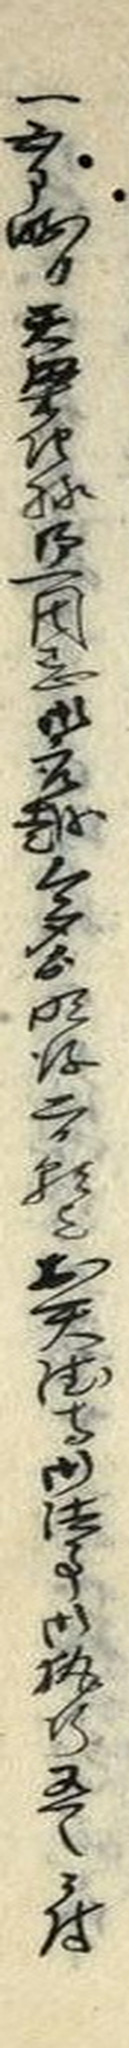一五月晦日天梁院様御一周忌御取越今夕ゟ明後二日朝迄於天徳寺御法事御執行有之ニ付

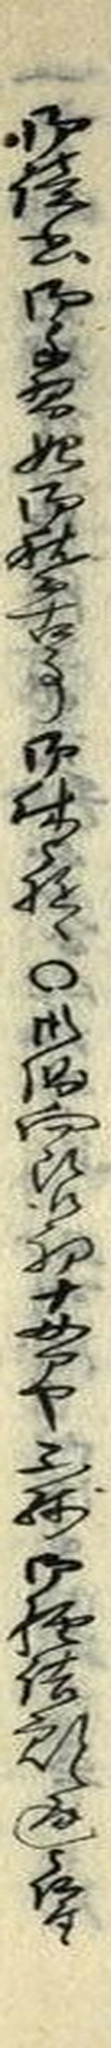御読書御手習始御稽古事御休被遊候〇御側向頭取初両部屋不残御経詰願之通被仰付候
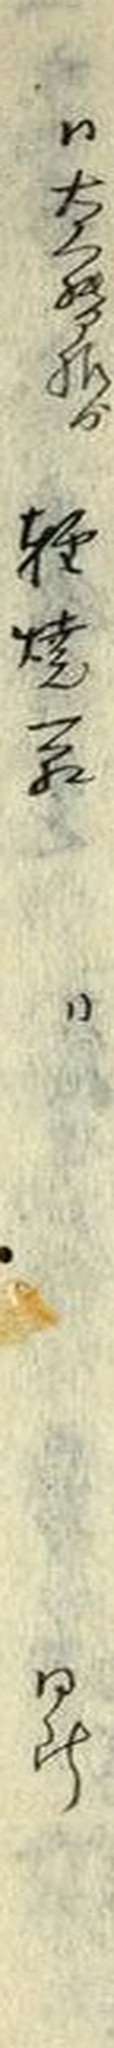同右衛門督様ゟ軽焼一箱同同断
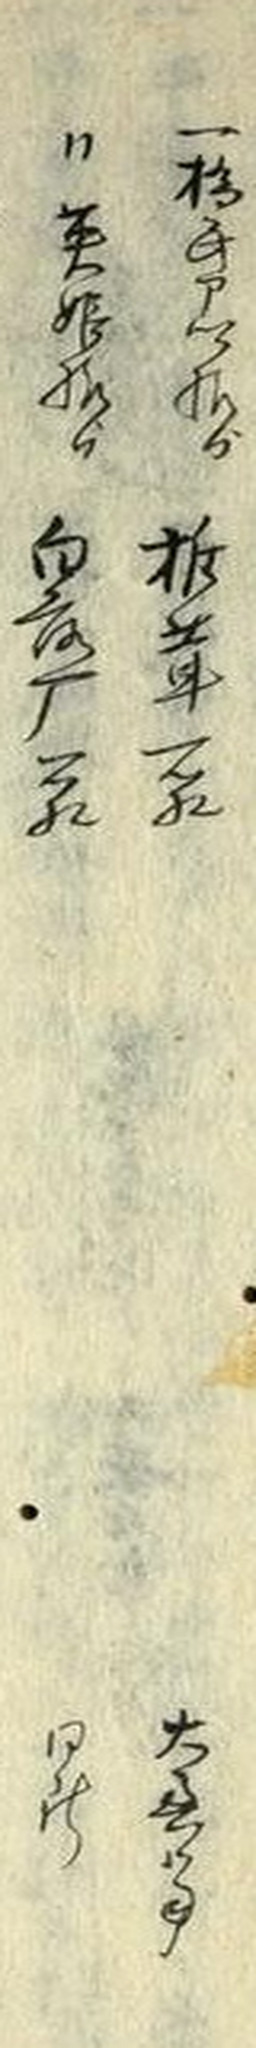同英姫様ゟ白落雁一箱同断
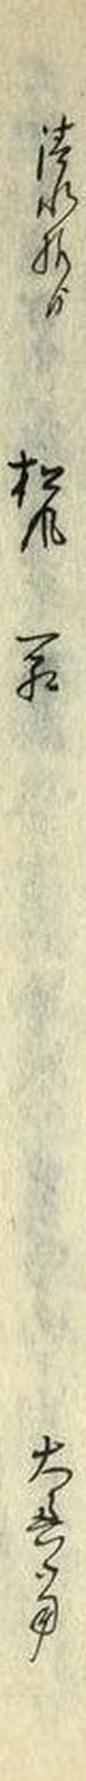清水様ゟ松風一箱大奥御用
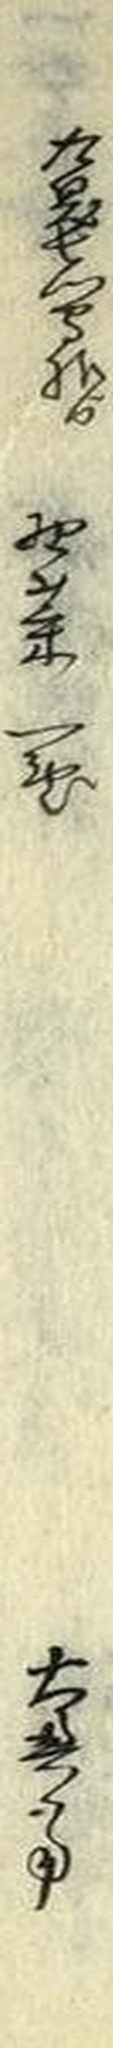九鬼長門守様ゟ野菜一台大奥御用
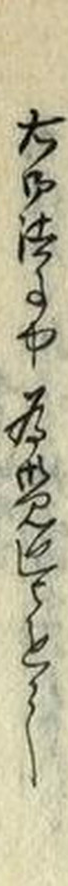右御法事中為御見廻被進之
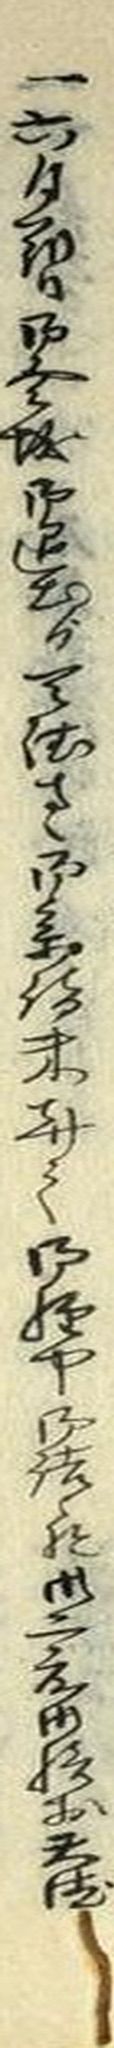一六月朔日御登城御退出ゟ天徳寺へ御参詣未刻之御経中御詰被遊御二度御膳於天徳
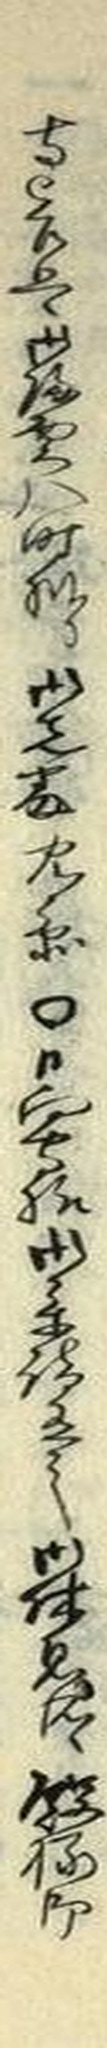寺被召上候御帰殿八時掛り御先番忠兵衛〇日向守様御参詣有之御休息所へ殿様御
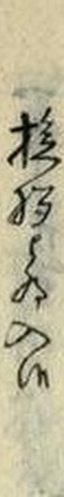挨拶被為入候
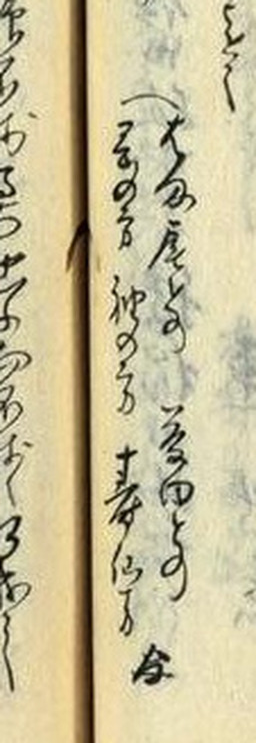岡の方袖の方寿仙方ゟ
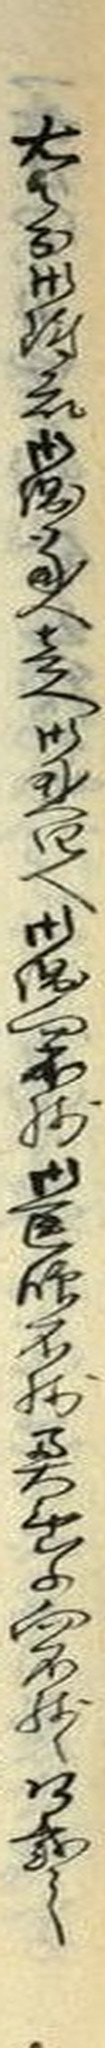右之分御附衆御側御用人壱人御用人四人御側向不残御医師不残奥台子向不残へ頂戴之
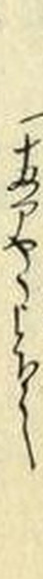両部屋へ被下之
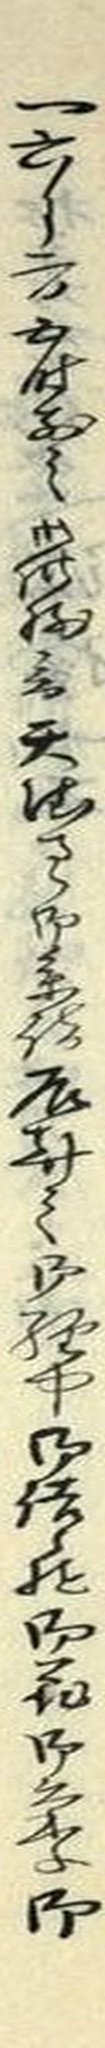一六月二日五時前之御供揃ニ而天徳寺へ御参詣辰刻之御経中御詰被遊御花御菓子御
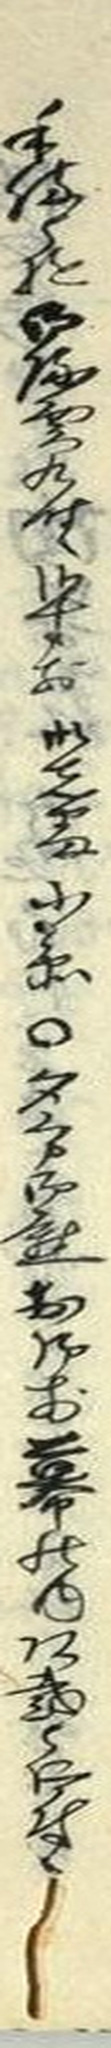手備被遊御帰殿九時へ弐寸前御先番小兵衛〇夕方御慰於御前幕の内頂戴被仰付候
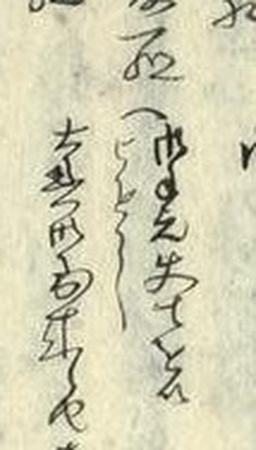被進之
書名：少傅日録抄（斉善付側向頭取日記、在府）
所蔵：福井県文書館 Fukui Prefectural Archives
